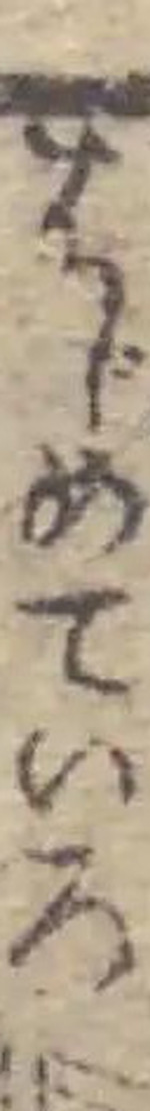はじめていろ
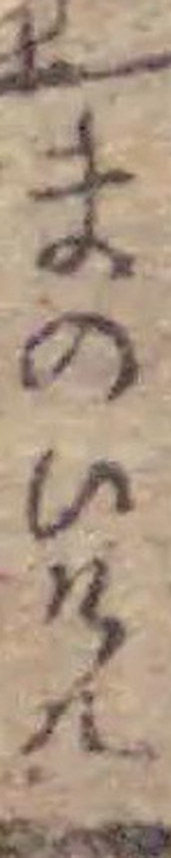まのいけん
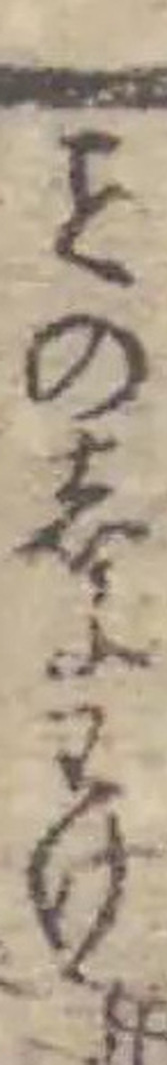ことのしよわけ
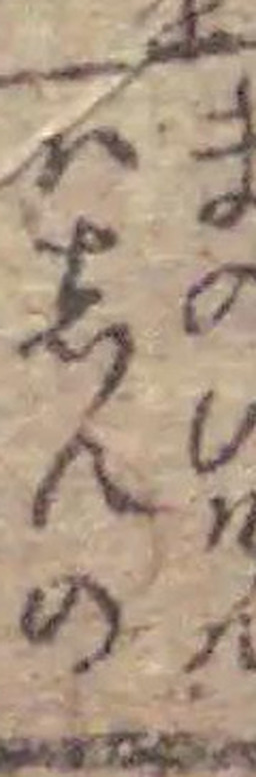はしんの
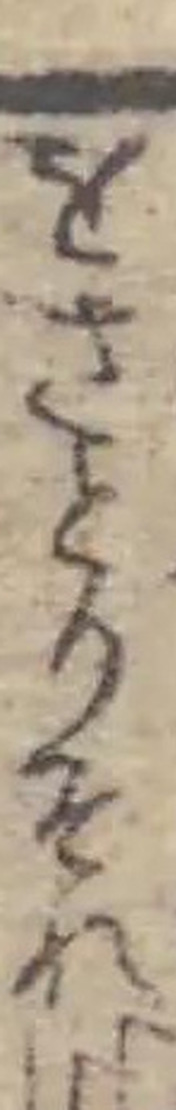をさとりそれ
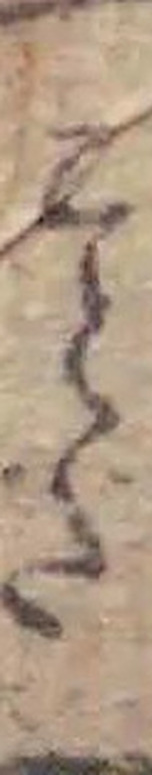ことだ
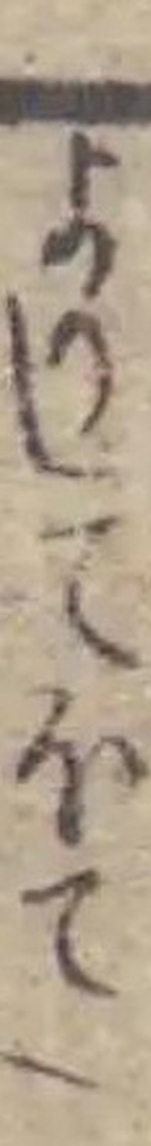よりしてほて
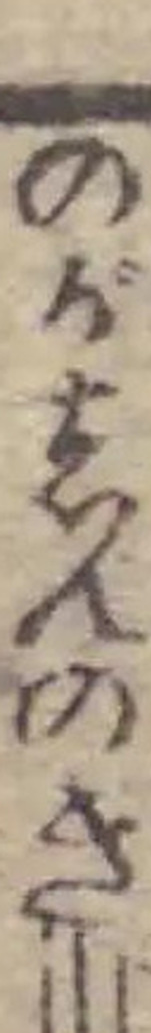のがしんのき
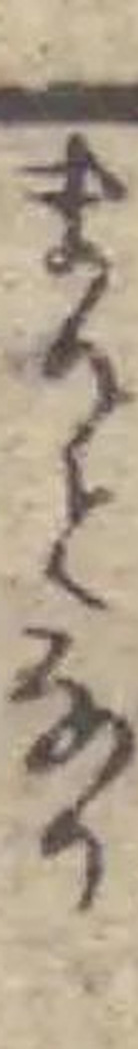まりとなり
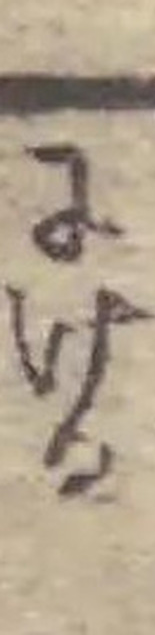にける
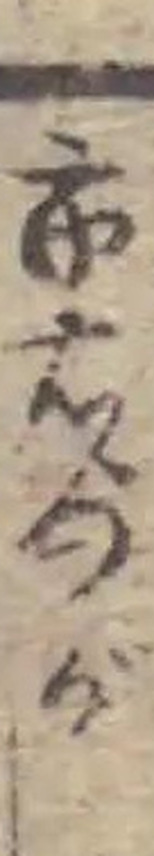市右様が
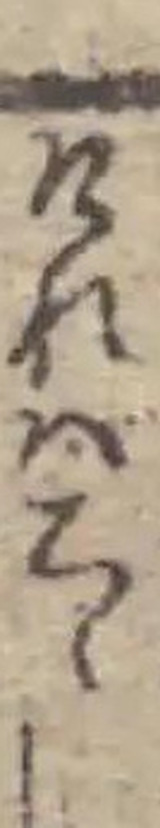けれはこゝ
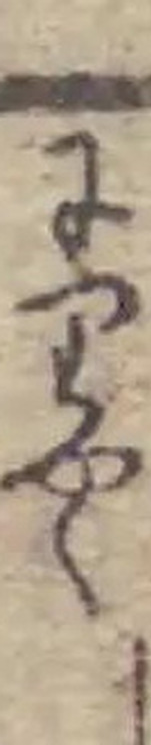にりやく
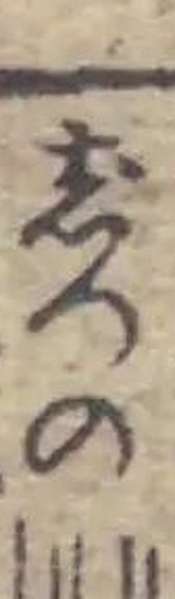じつの
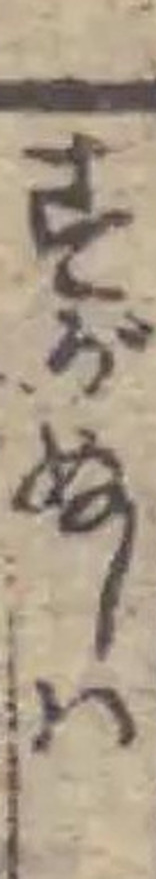すがぬしは
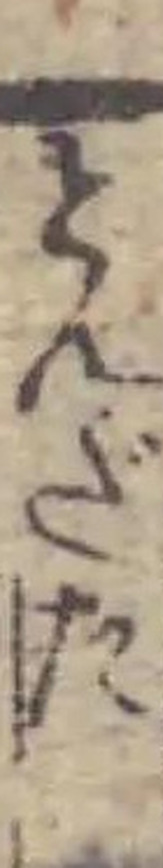とんだた
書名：色男其処此処 3巻
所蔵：国立国会図書館 National Diet Library, JAPAN
